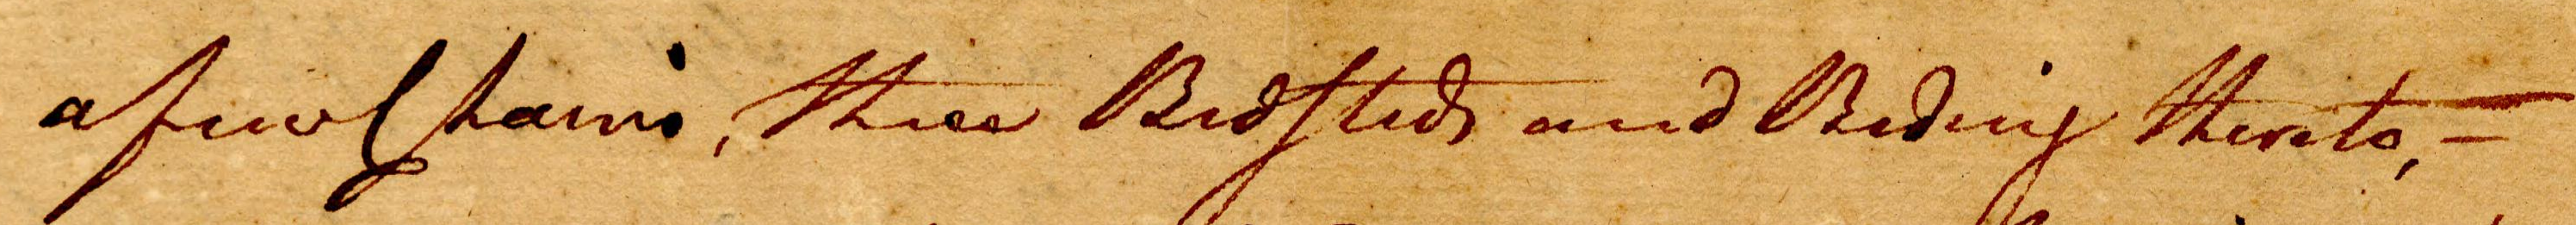a few Chairs, three Bedsleds and Beding thereto.-
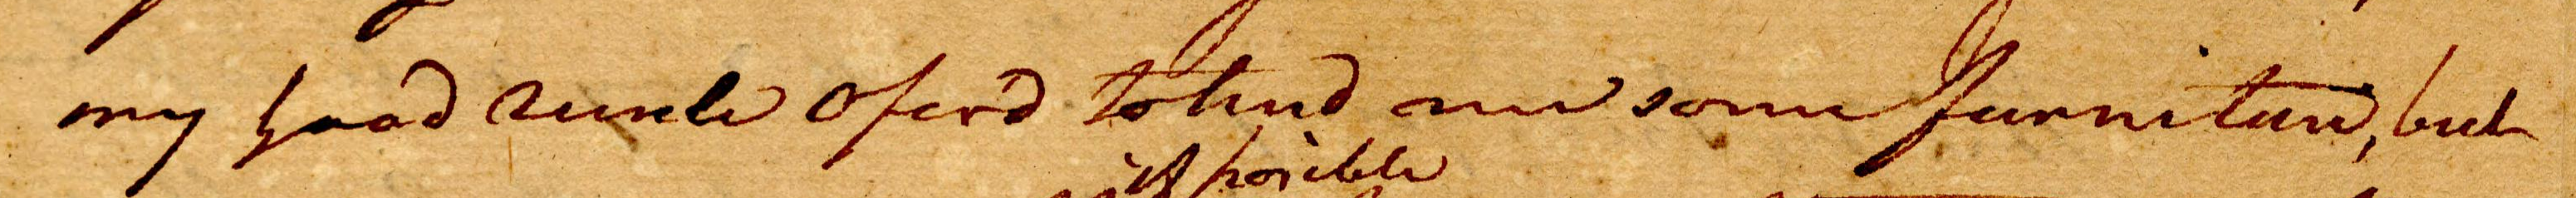my good Uncle oferd to lend me some furniture, but
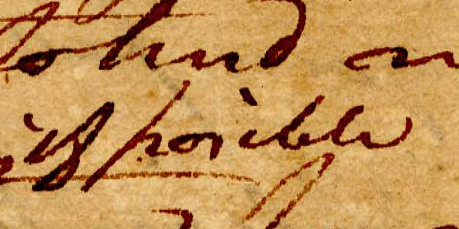if possible
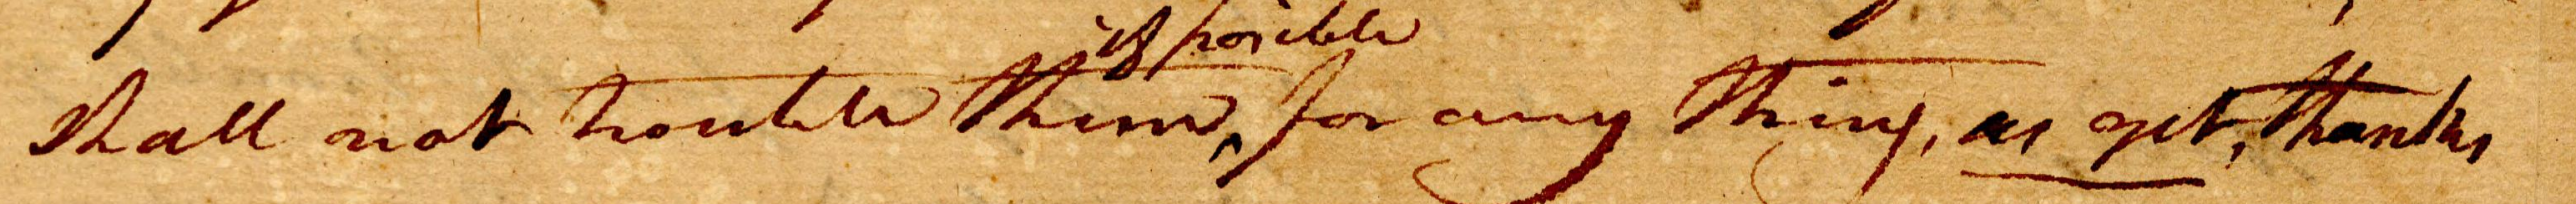shall not trouble them ^ for any thing as yet thanks
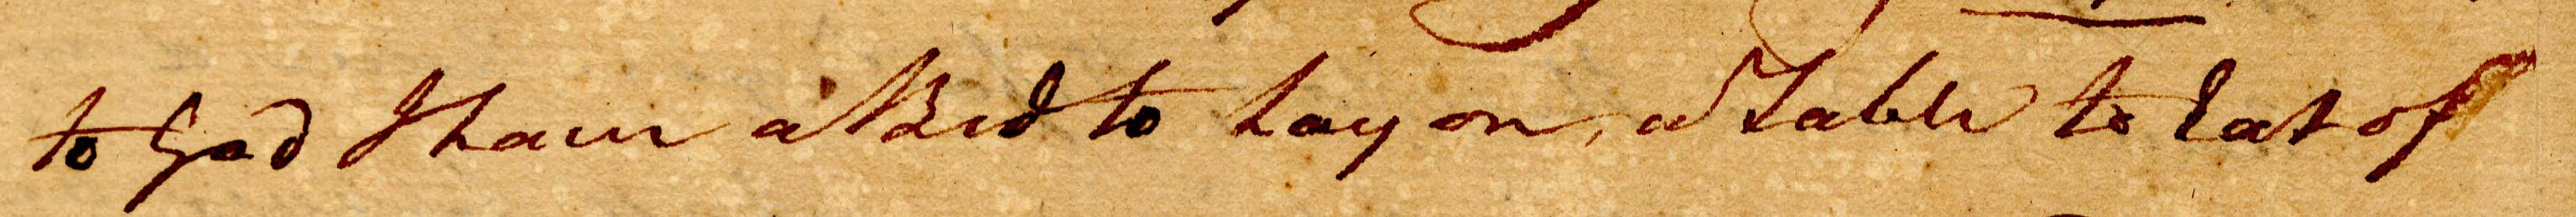to God I have a Bed to Lay on, a Table to Eat of
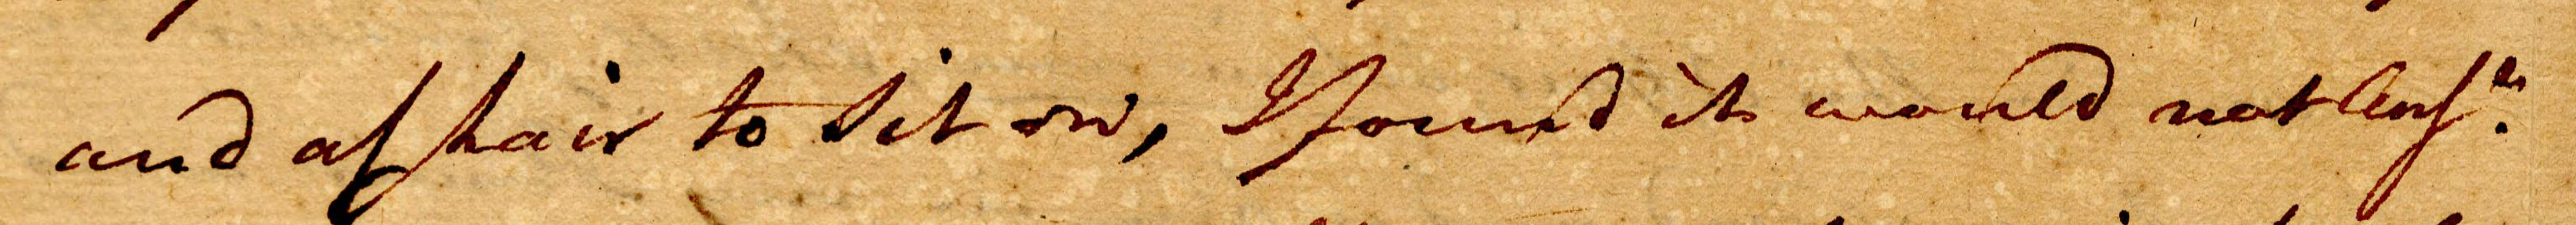and a chair to sit on, I found it would not Ans^r.
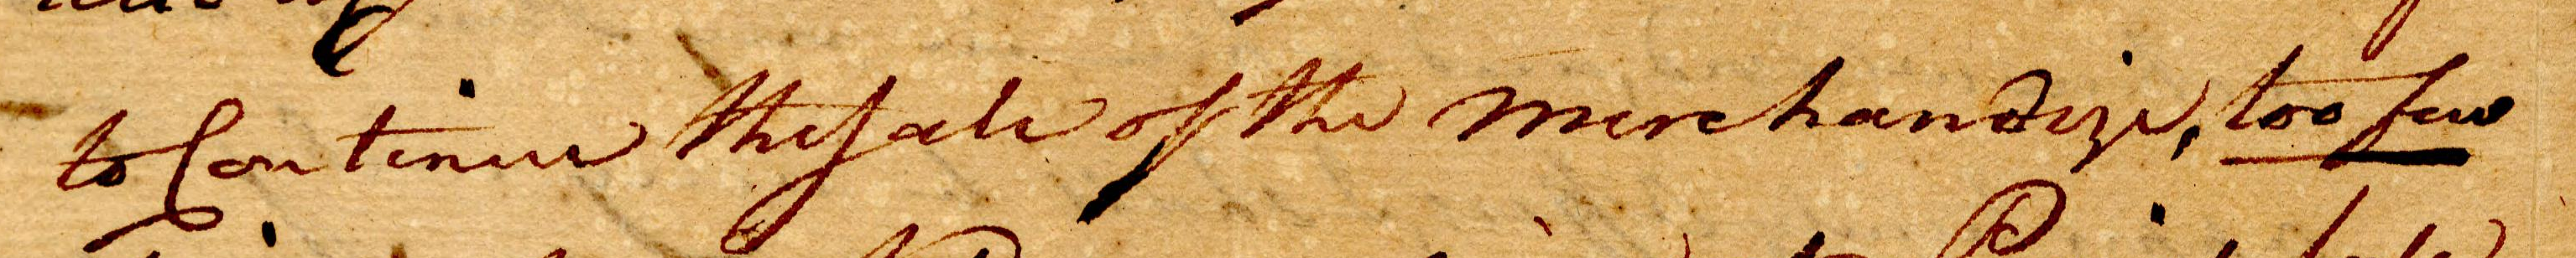to Continue the sale of the merchandize, too few
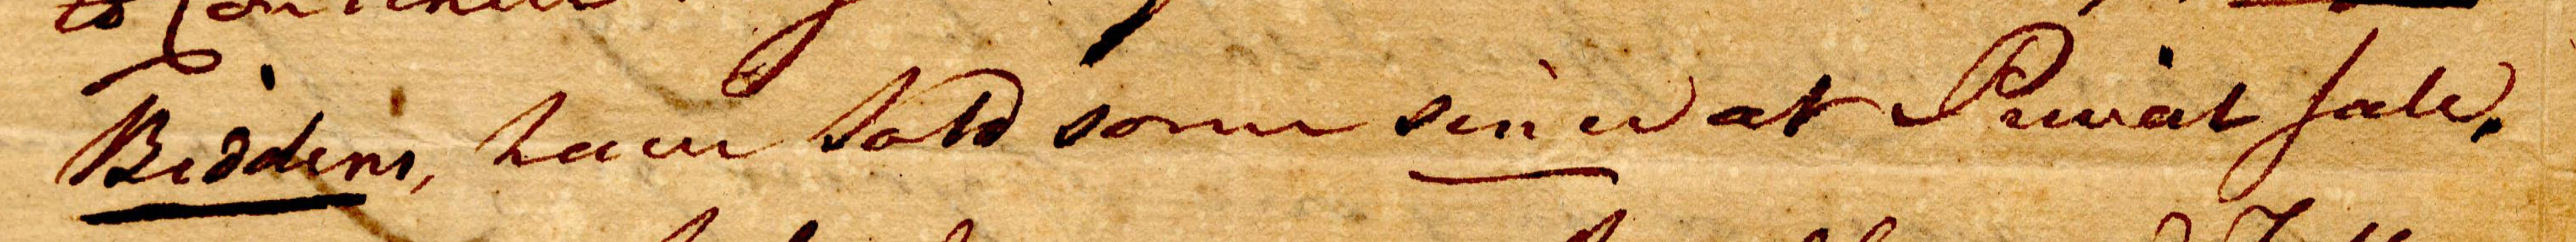Biddens, have Sold some since at Private sale,
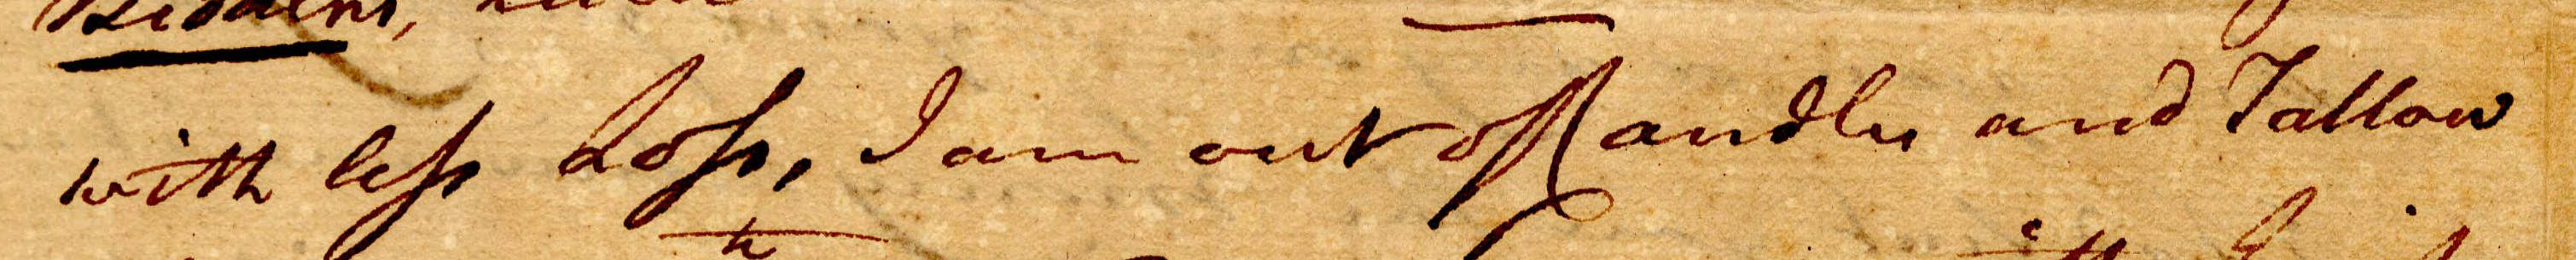with less Loss, I am out of Candles and Tallow
